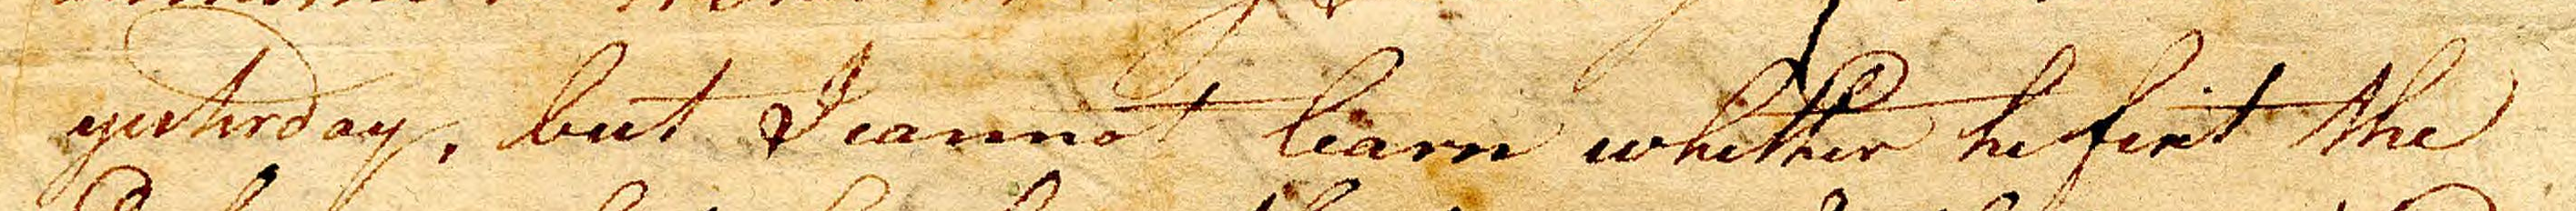yesterday, but I cannot learn whether he Sent the
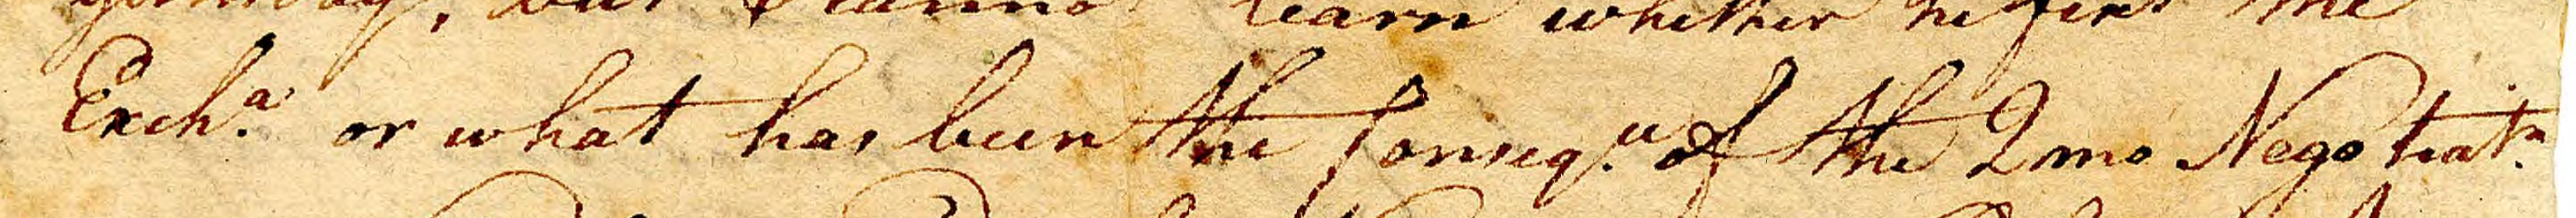Exch^a. or what has been the Conseq^ce. of the 2 mo Negotiat^n.
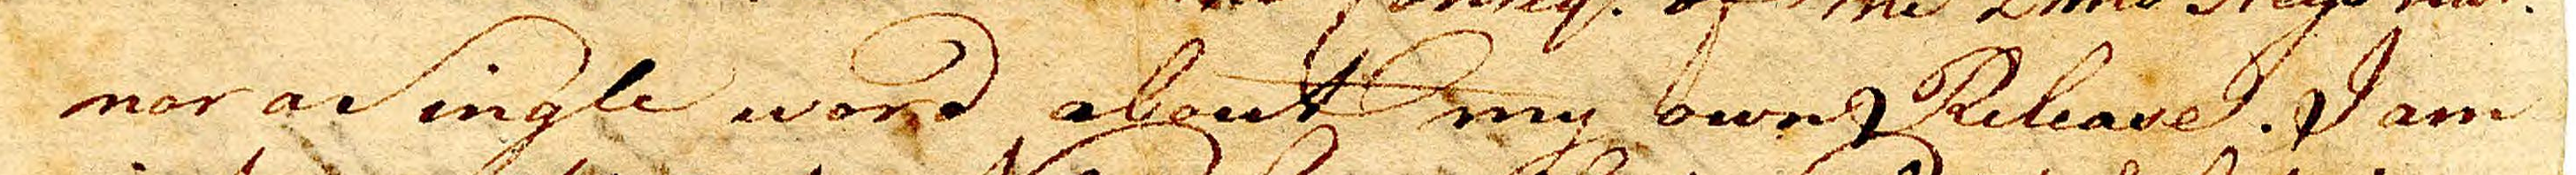nor a Single word about my own Release. I am
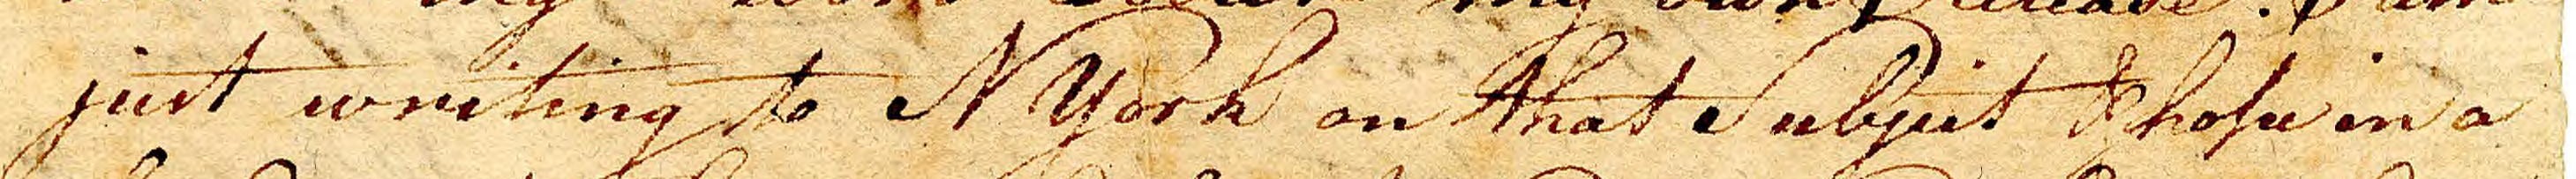just writing to N York on that Subject & hope in a
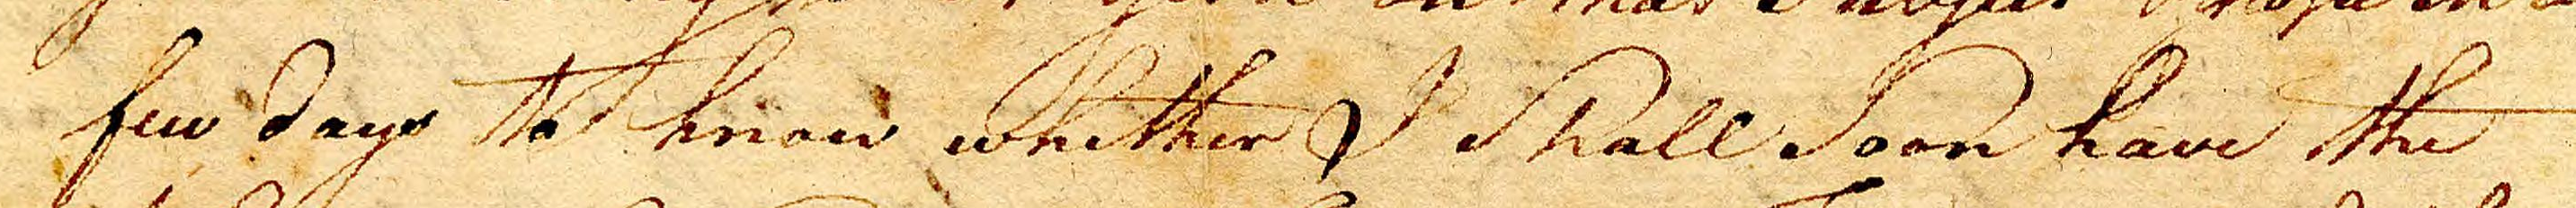few days to know whether I Shall soon have the
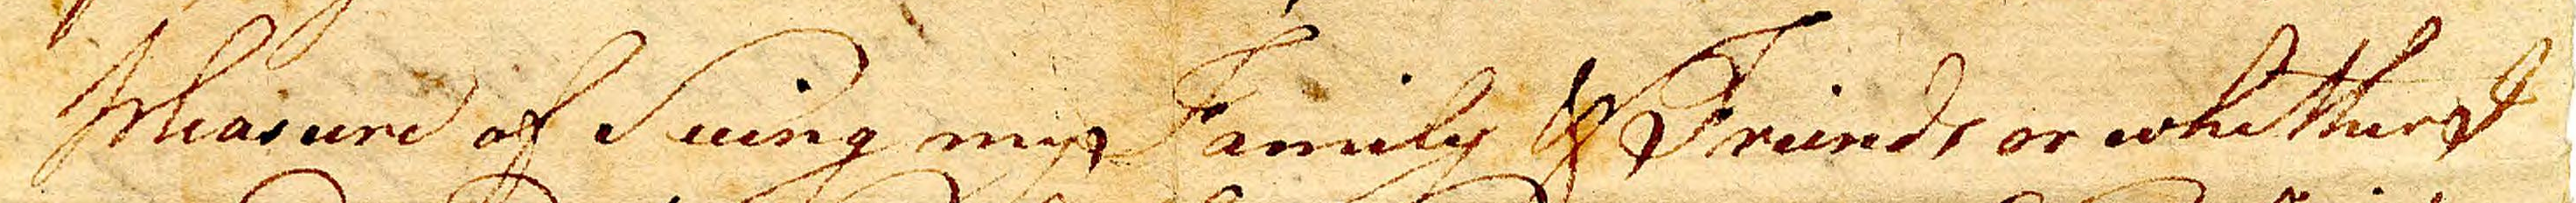pleasure of Seeing my Family & Friends or whether I
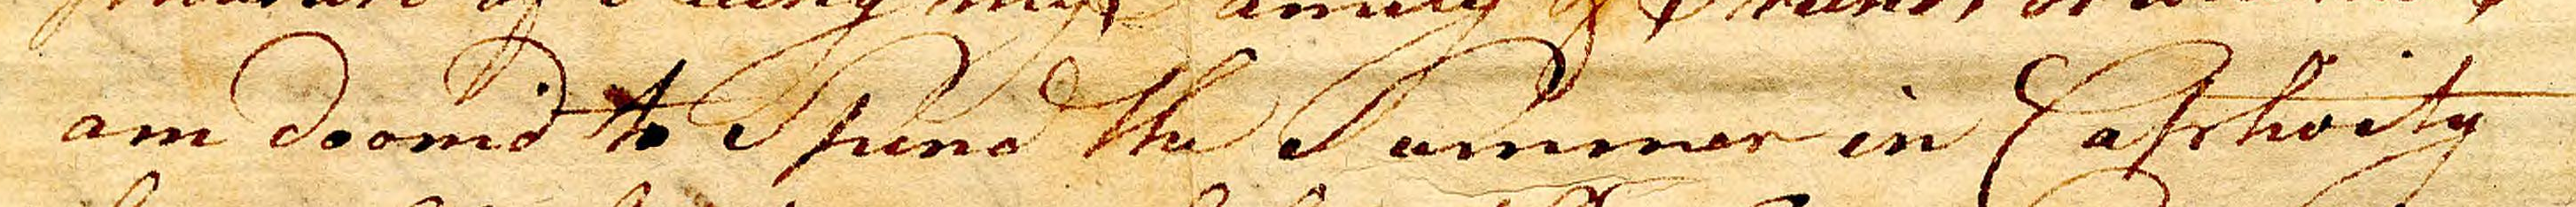am doom'd to Spend the Summer in Captivity
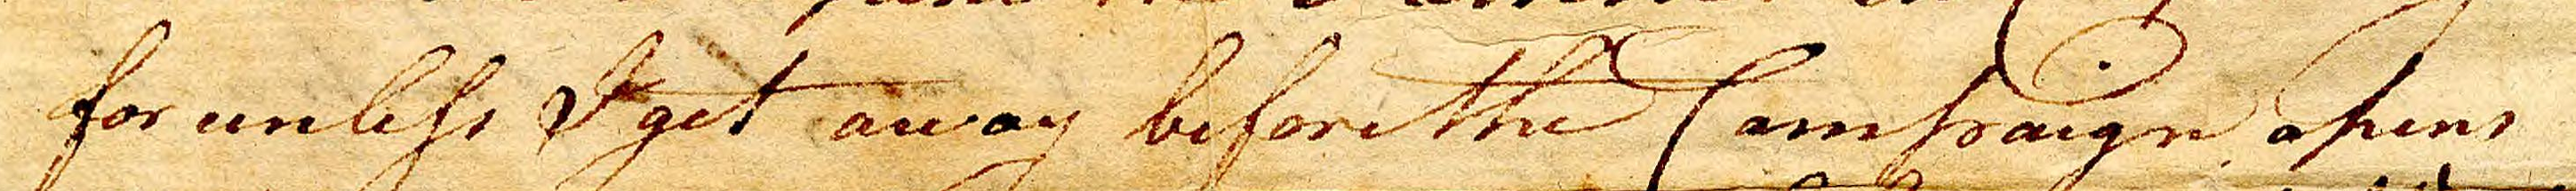for unless I get away before the Campaign opens
